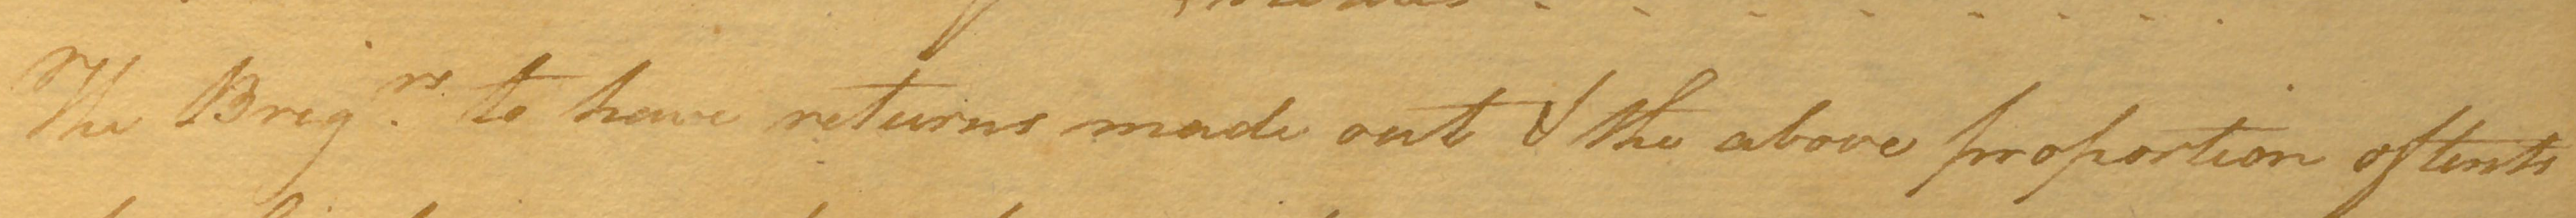The Brig^rs. to have returns made out & the above proportion of tents
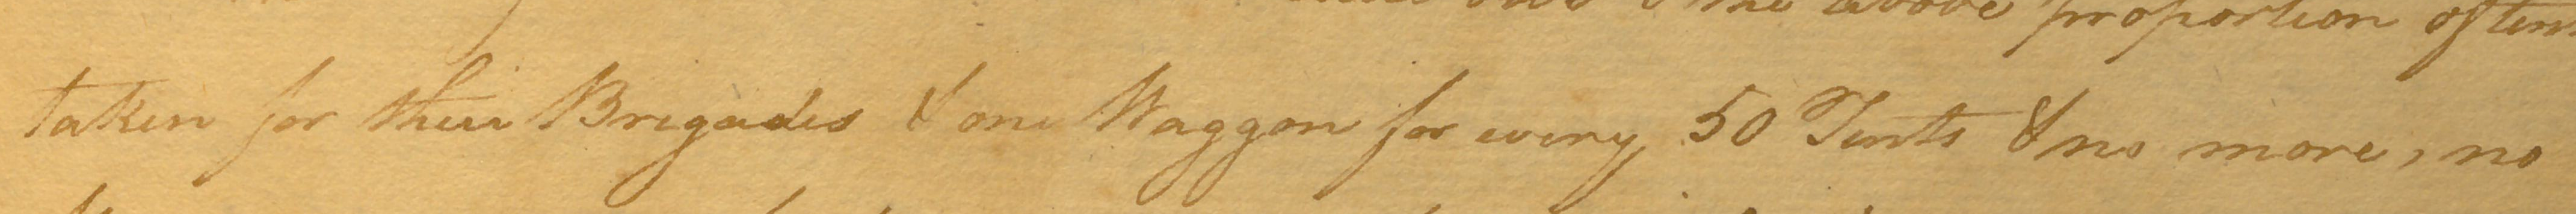taken for their Brigade & one Waggon for every 50 Tents & no more, no
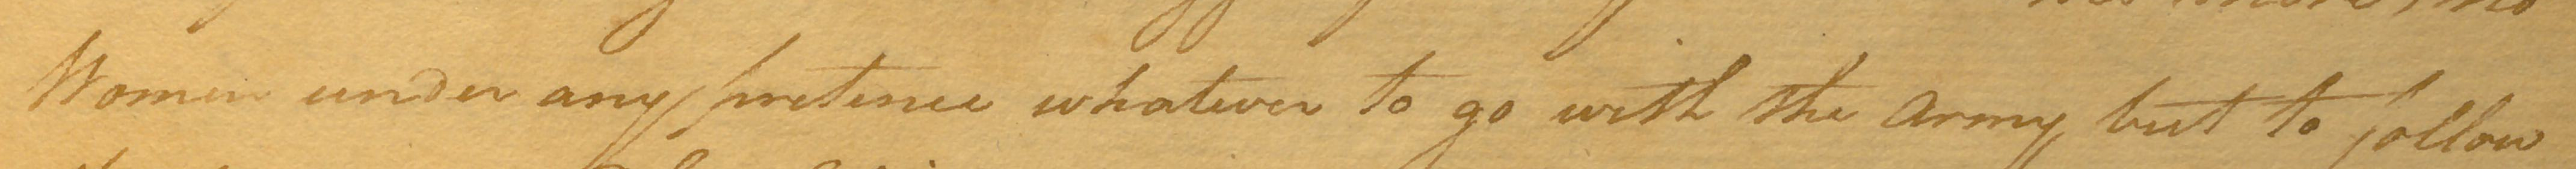Women under any pretence whatever to go with the Army but to follow
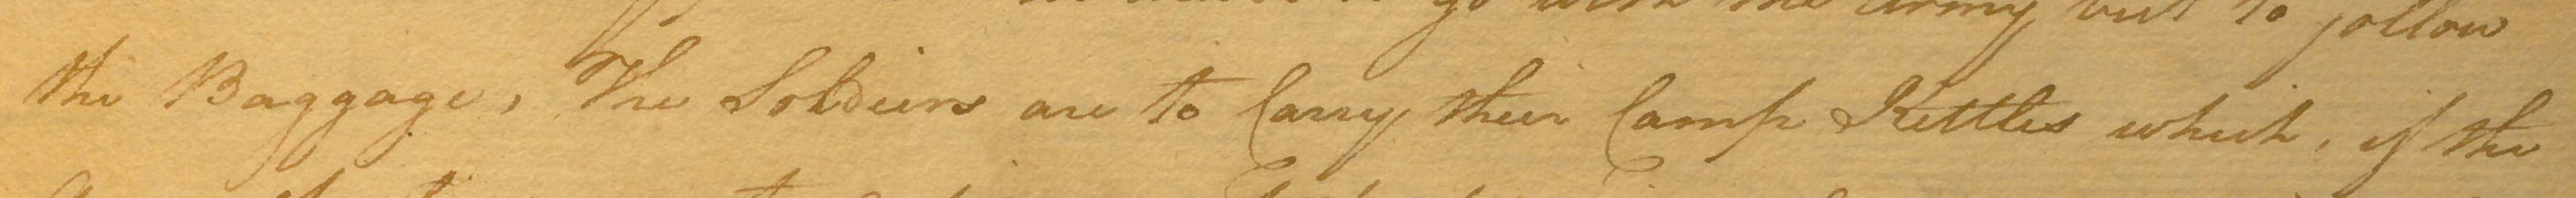the Baggage, The Soldiers are to Carry their Camp Kettles which, if the
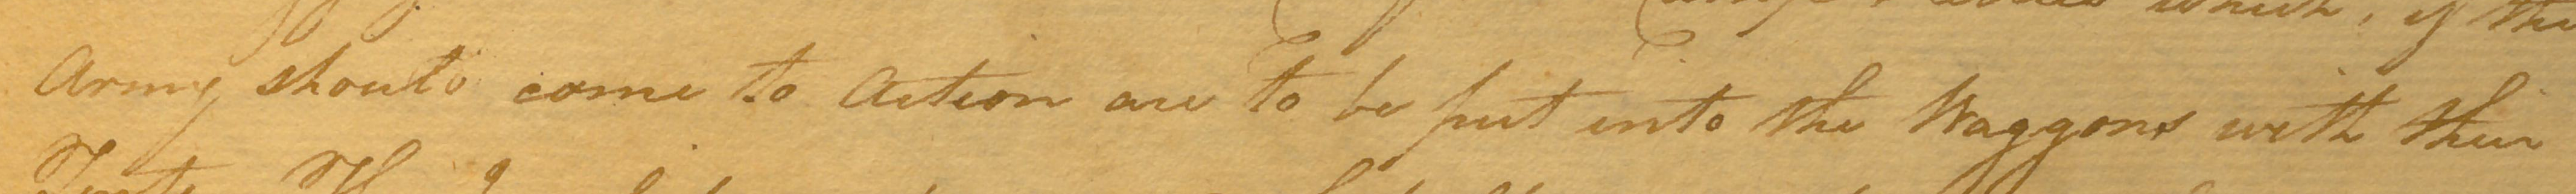Army should come to Action are to be put into the Waggons with their
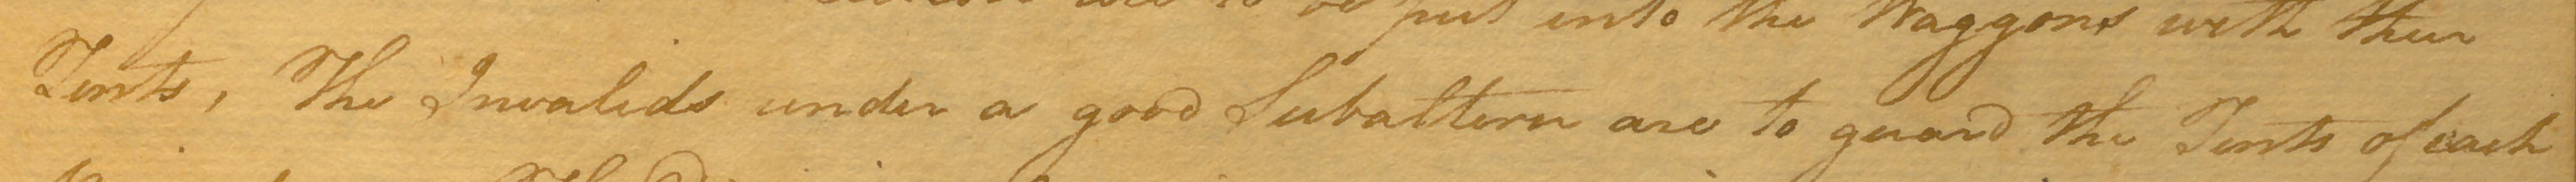Tents, The Invalids under a good Subaltern are to guard the Tents of each
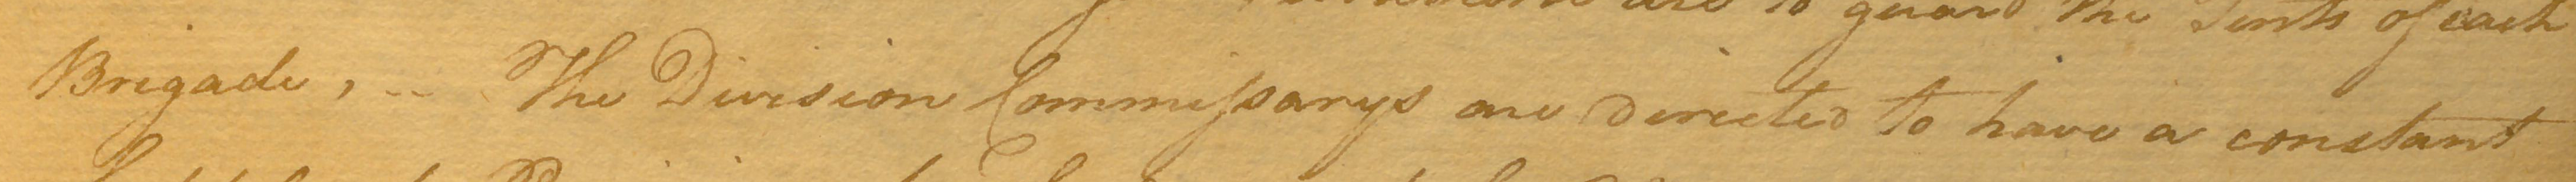Brigade.- The Division Commissarys are directed to have a constant
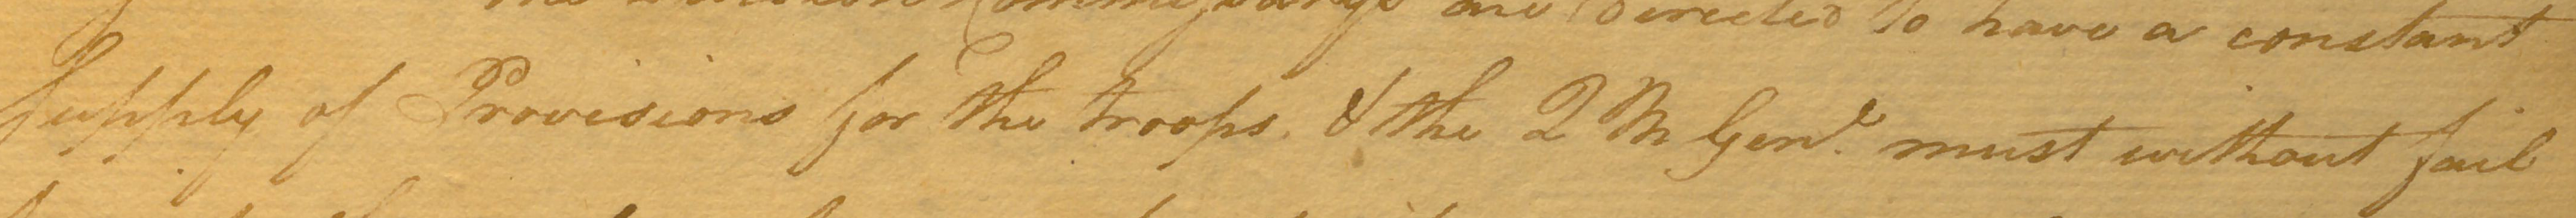Supply of Provisions for the troops & the 2 M Gen^l. must without fail
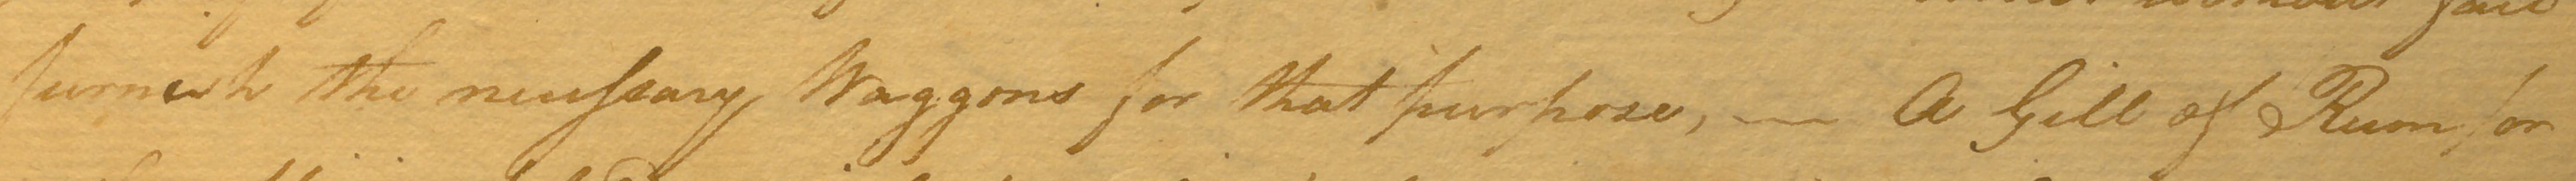furnish the necessary Waggons for that purpose.- A Gill of Rum /or
